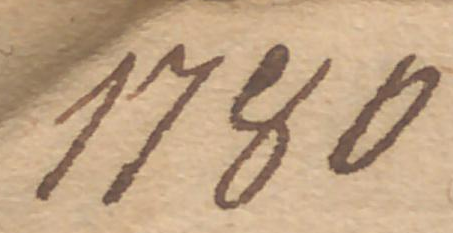1780
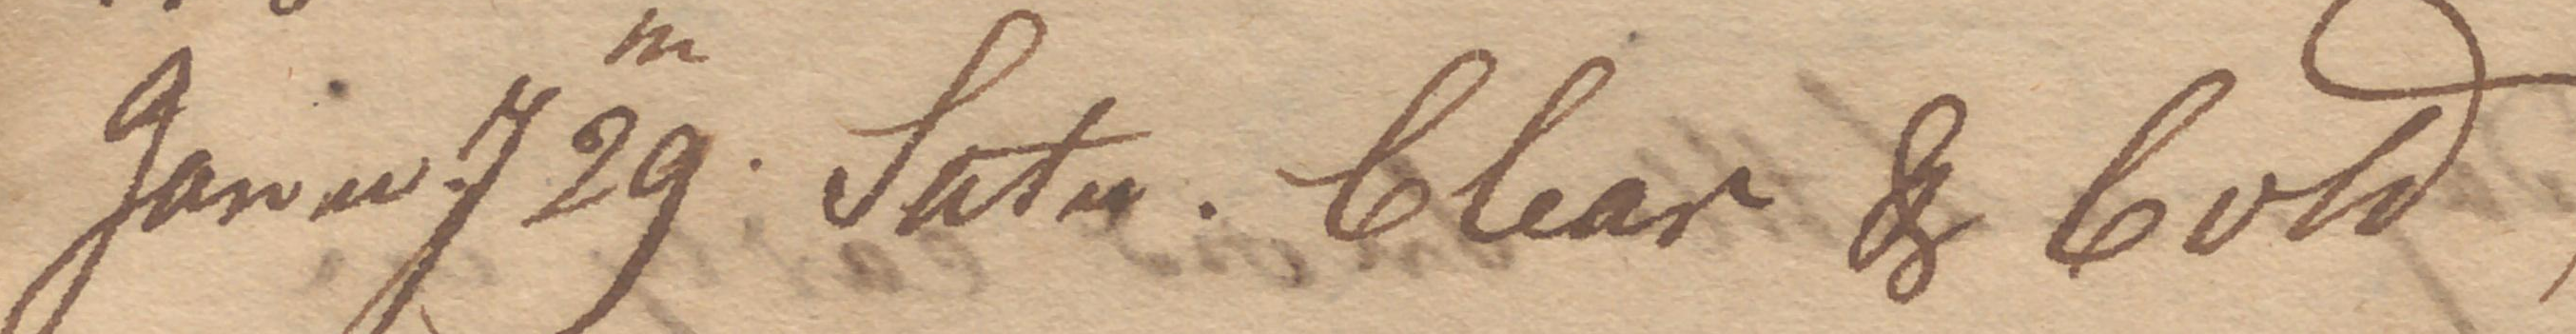Janu^y. 29^th Satu. Clear & Cold
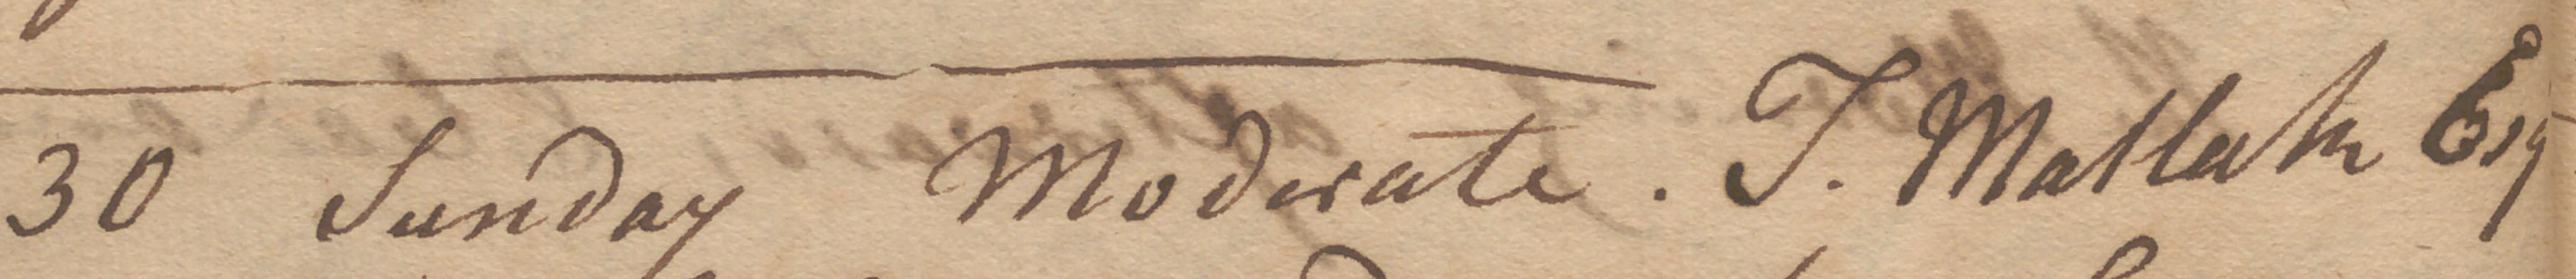30 Sunday Moderate. T. Matlak Esq
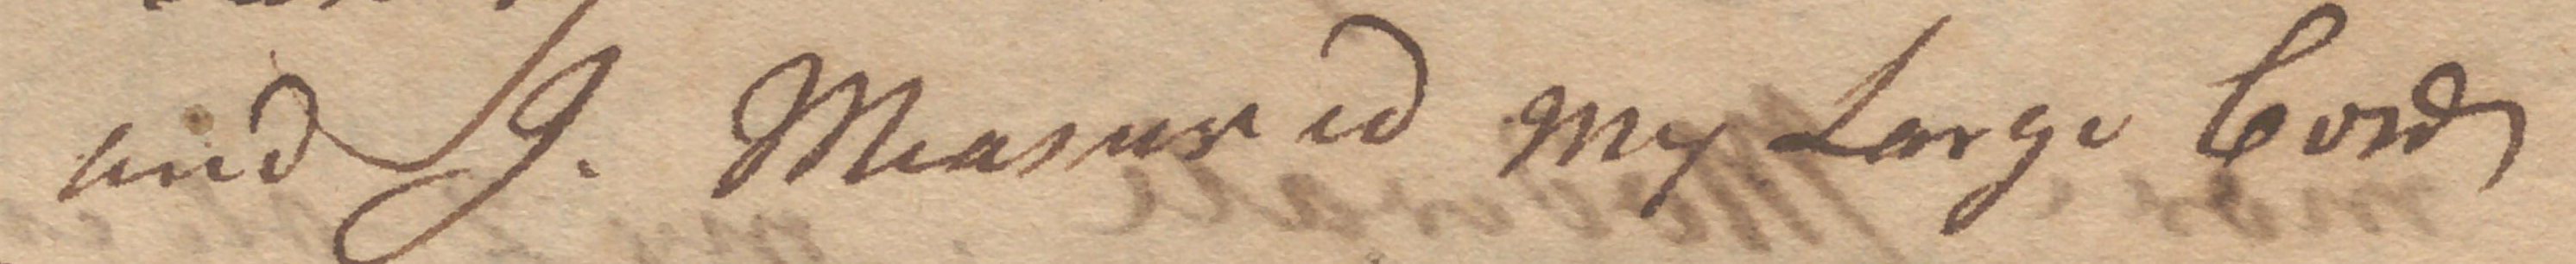and I. Measured my Large Cow
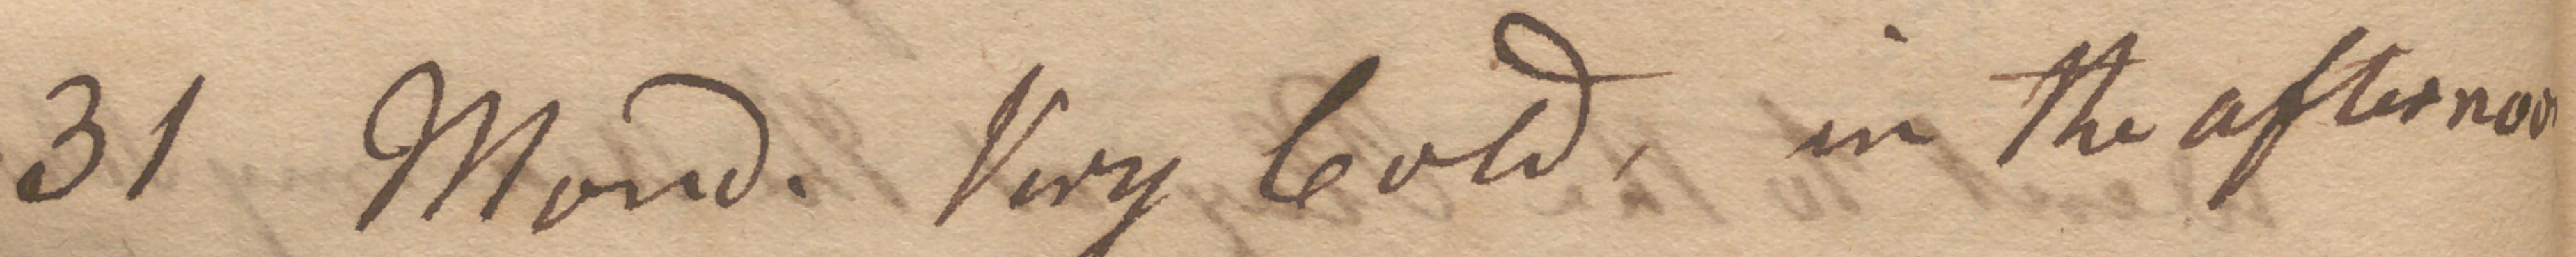31 Mond. Very Cold, in the afternoon
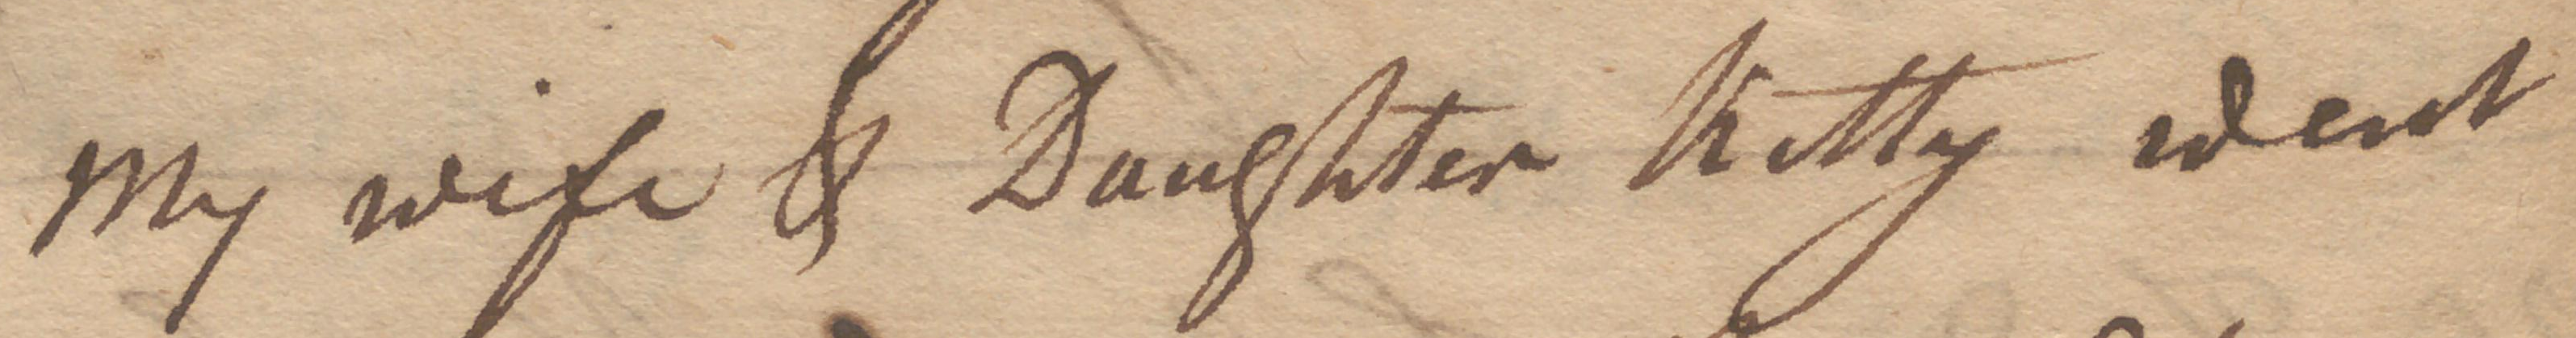my wife & Daughter Kitty went
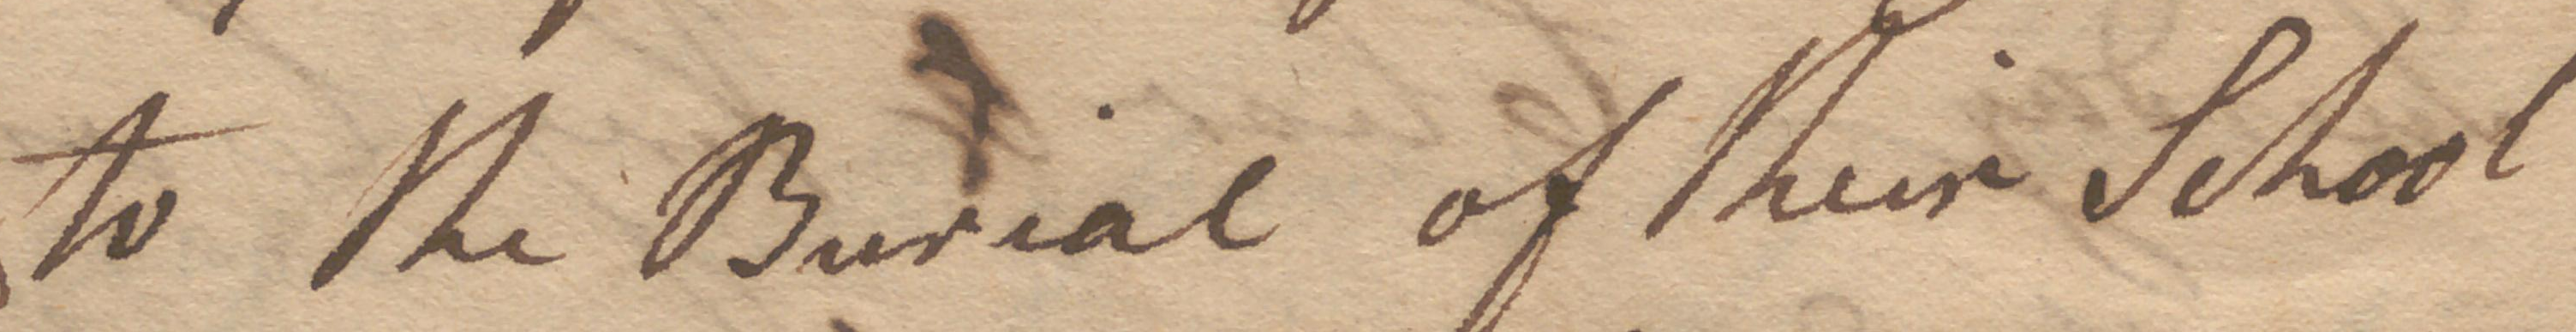to the Burial of their School
